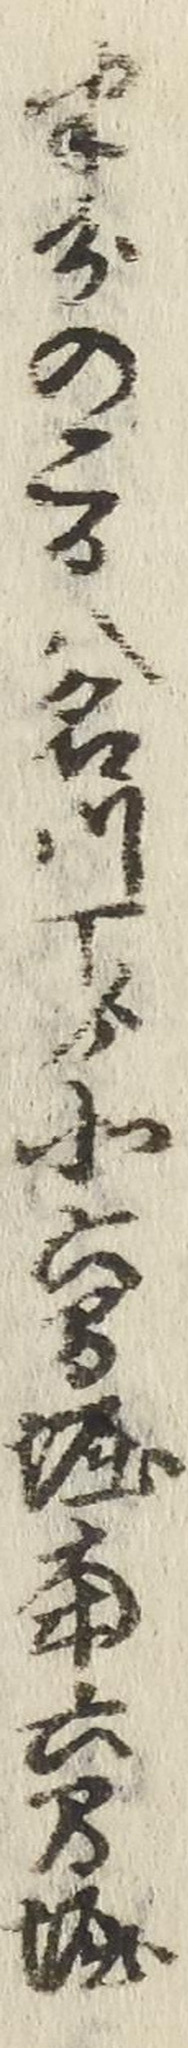半分のこる八名川丁ゟ北六間堀南六間堀
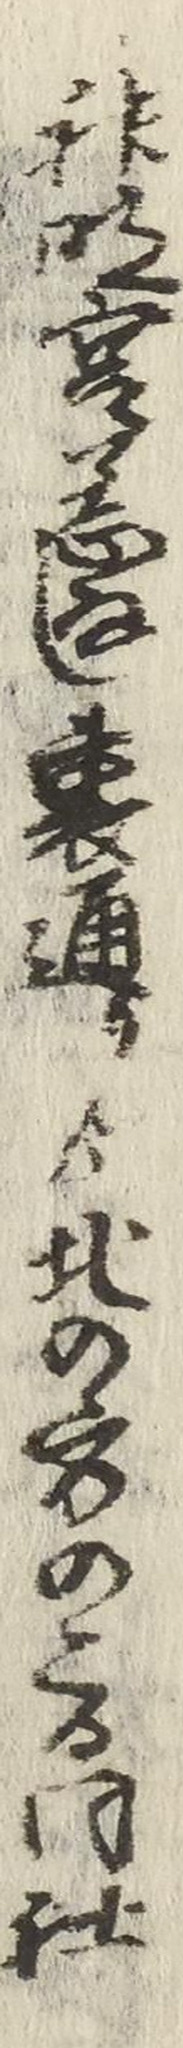神明宮恙なし裏通りゟ北の方のこる同社
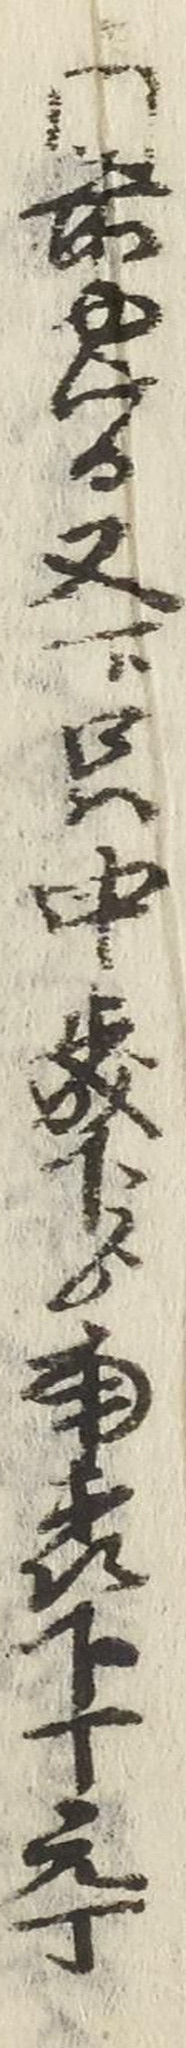門前やける又一ㇳ口は中森下ゟ南森下丁元丁
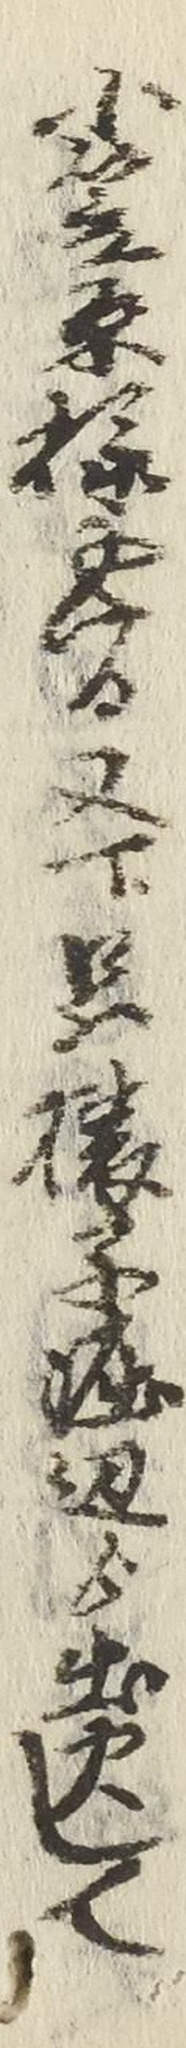小笠原様やける又一ㇳ口は猿子堀辺ゟ出火して
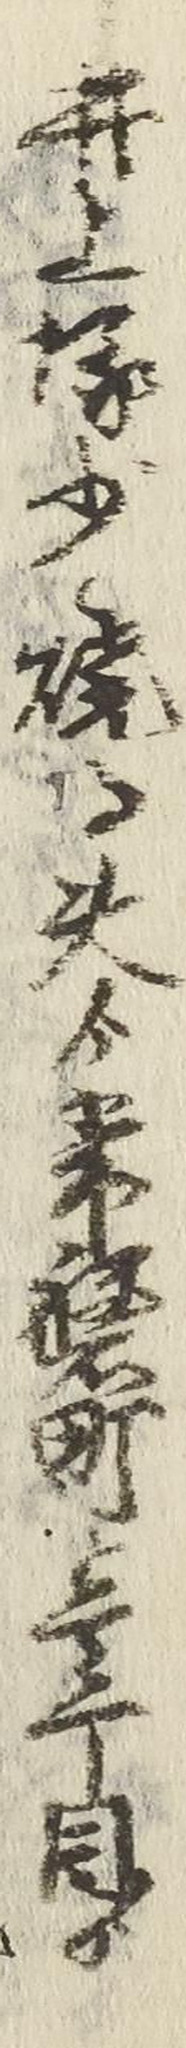井上様少々焼る夫ゟ常磐町壱丁目ゟ
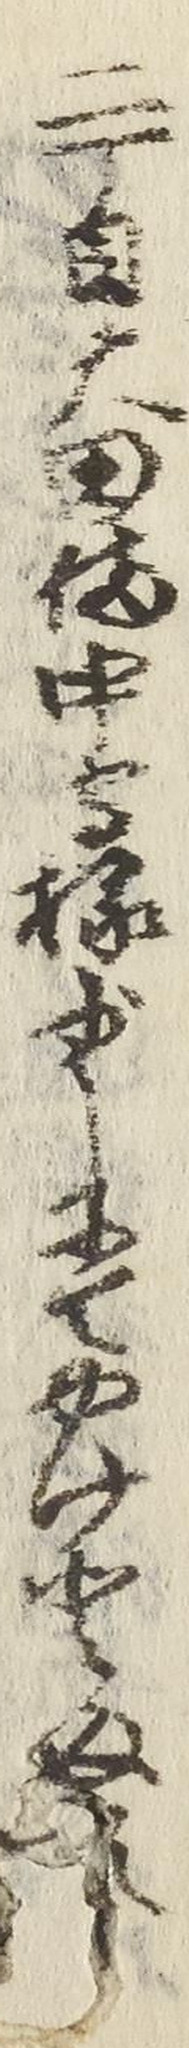二丁目大田備中守様少しにてやけ所々へる
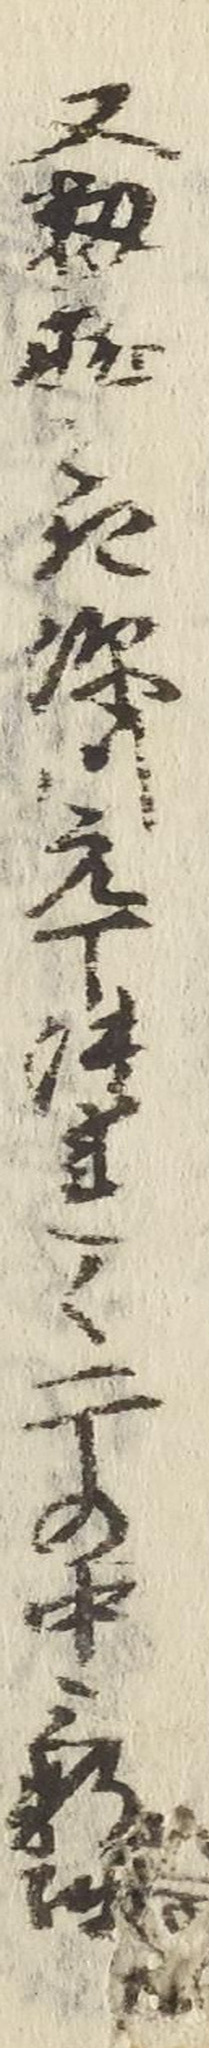又籾蔵とき深川元丁潰れて一丁の中三軒残
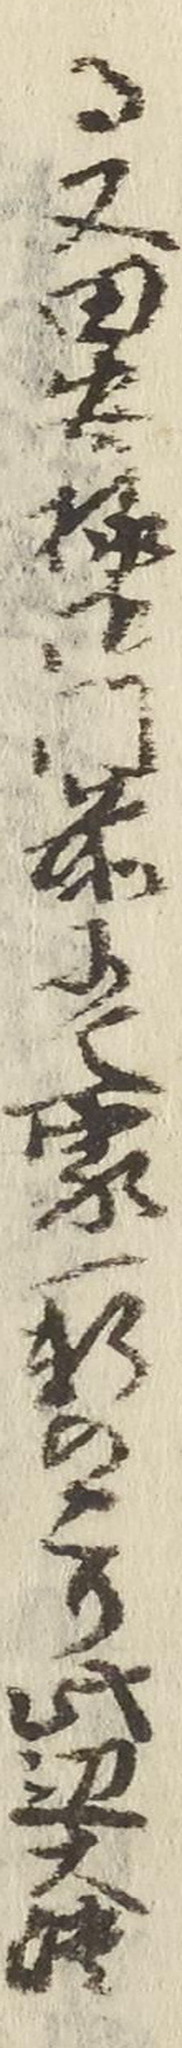る又田安様御門前にて一家一軒のこり此辺大潰
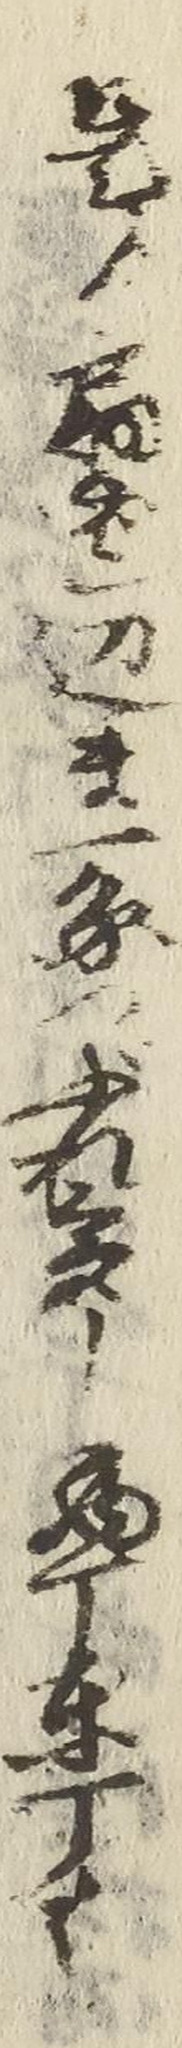是ゟ扇ばし辺ま一円つぶれ多し西丁東丁は
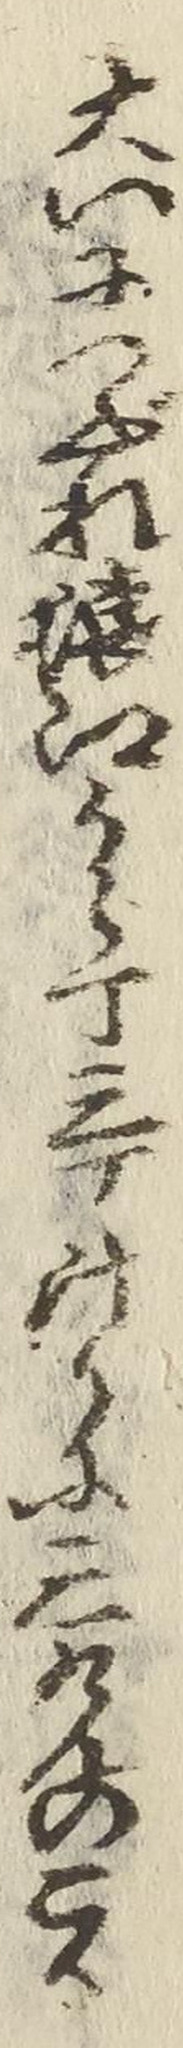大いにつぶれ猿江うら丁三丁計りに三けんのこる
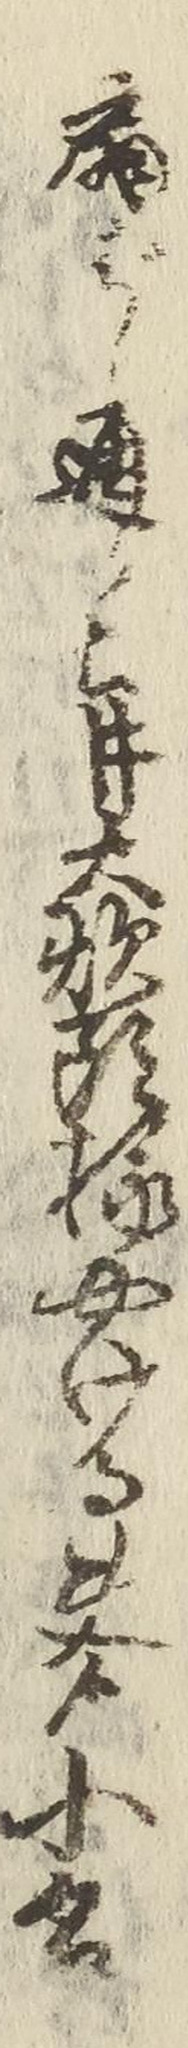扇ばし通り土井大炊頭様やける夫ゟ小名
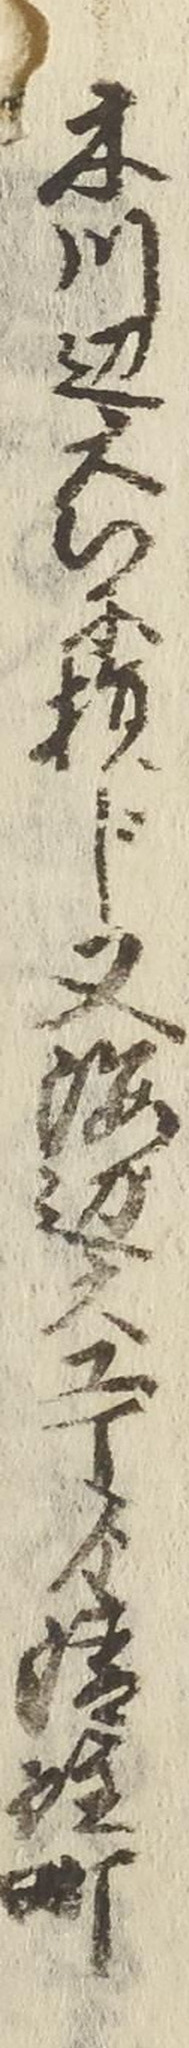木川辺大いに損じ又海辺大工丁ゟ清澄町
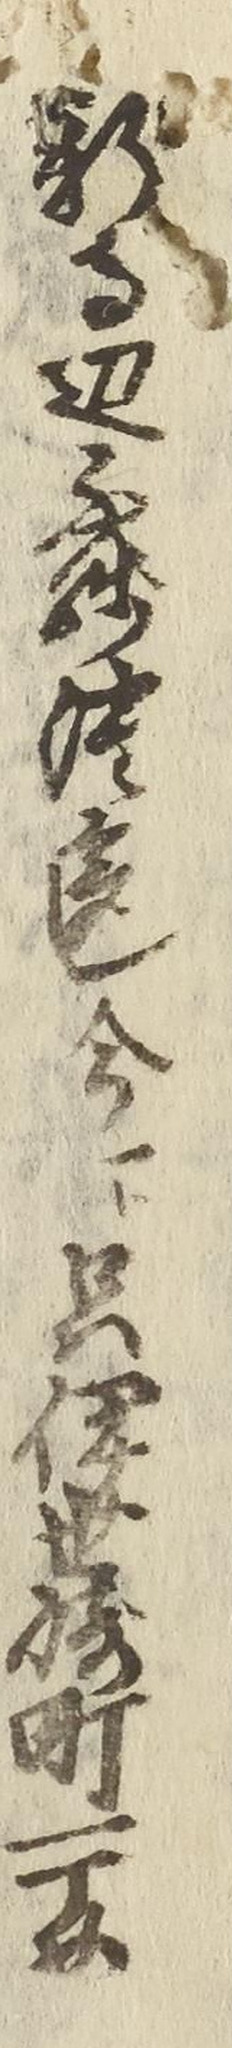新寺辺不残潰多し今一ト口は伊世﨑町一丁め

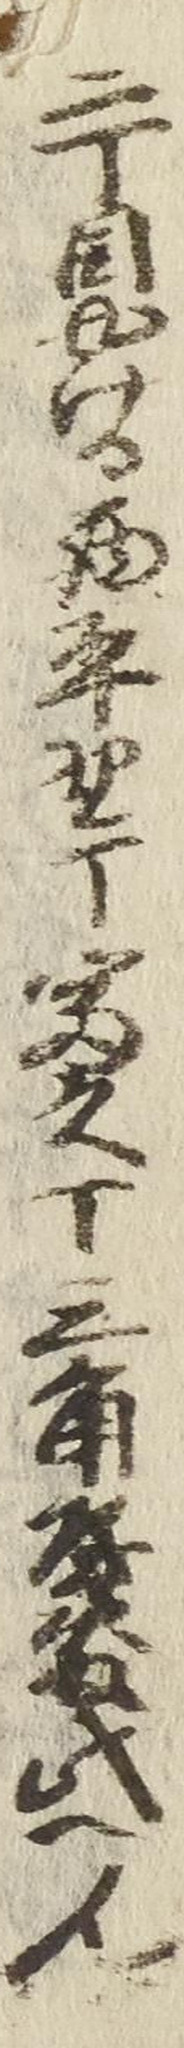二丁目やける西平野丁富久丁三角屋敷此へん
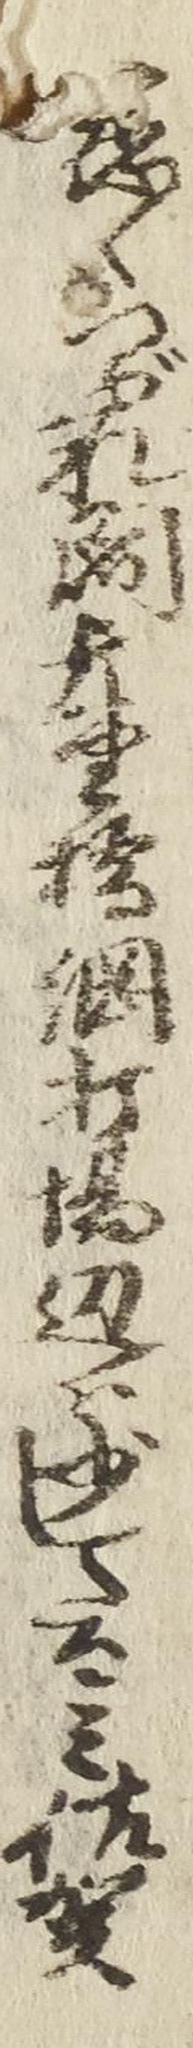悉くつぶれ閻魔堂橋網打場辺は少したるみ佐賀
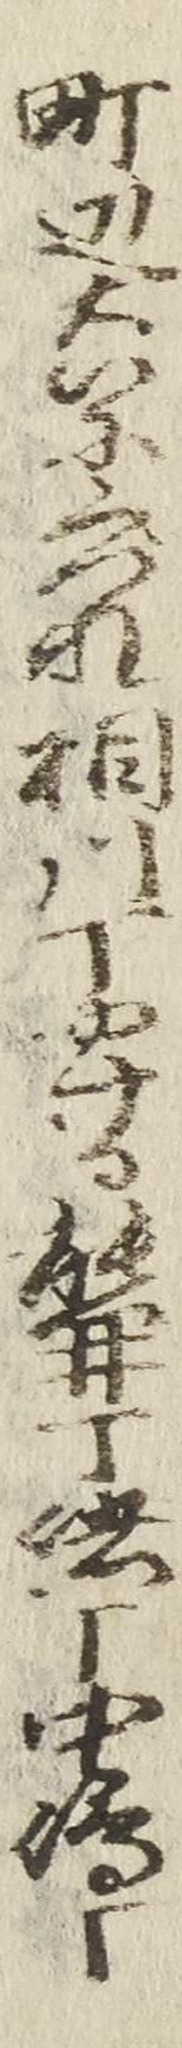町辺大いにくづれ相川丁やける熊井丁諸丁中嶋丁
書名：地震出火　男女死人怪我人書上之寫
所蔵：東京大学地震研究所図書室 Earthquake Research Institute Library, The University of Tokyo, JAPAN
